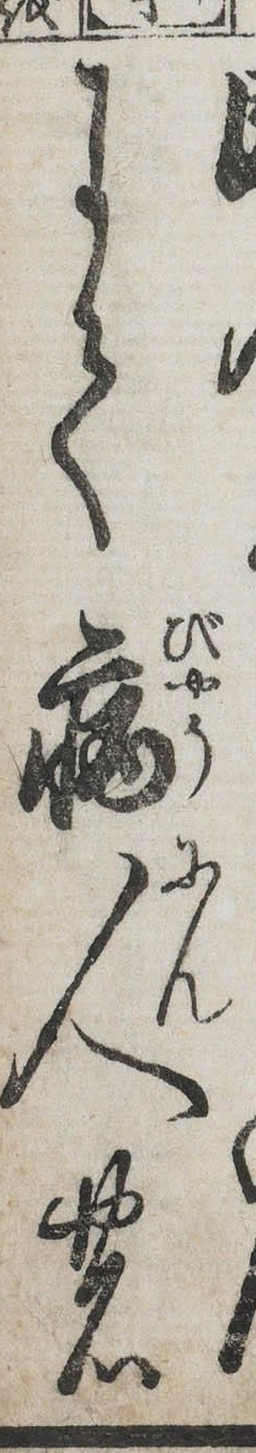にて病人の

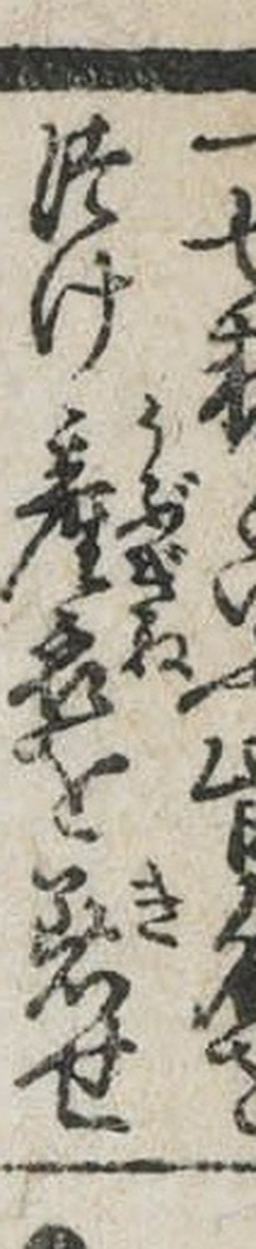つけ産衣を着せ
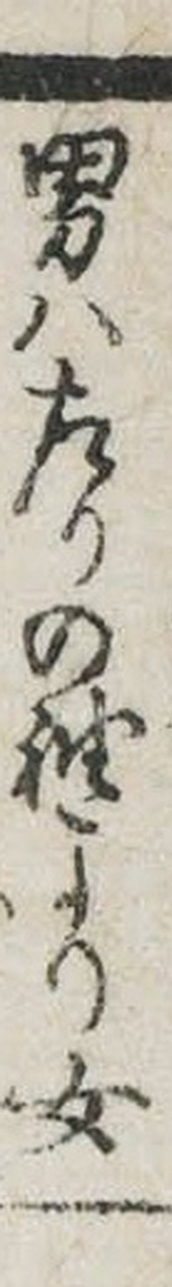男は左りの袖より女
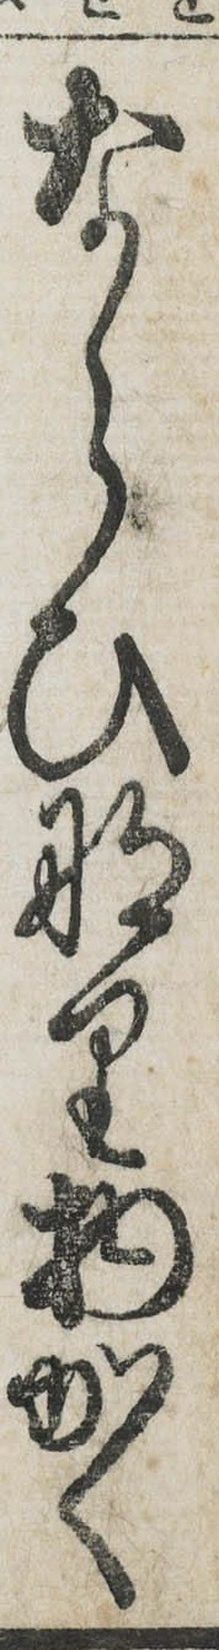ならひなり物かく
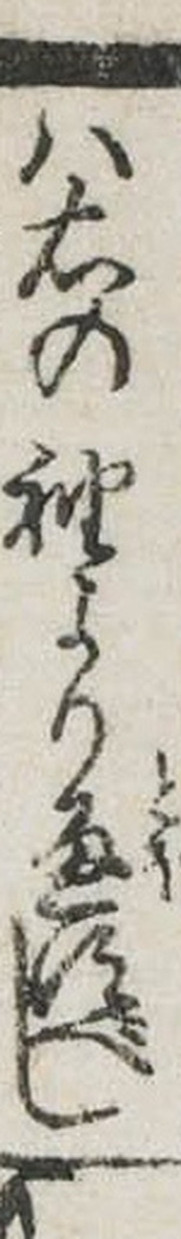は右の袖より通すべし
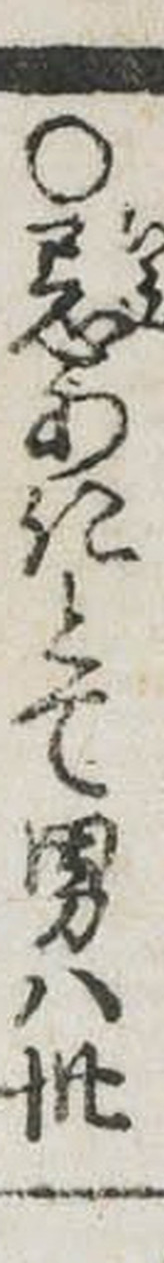○忌あきとて男は卅
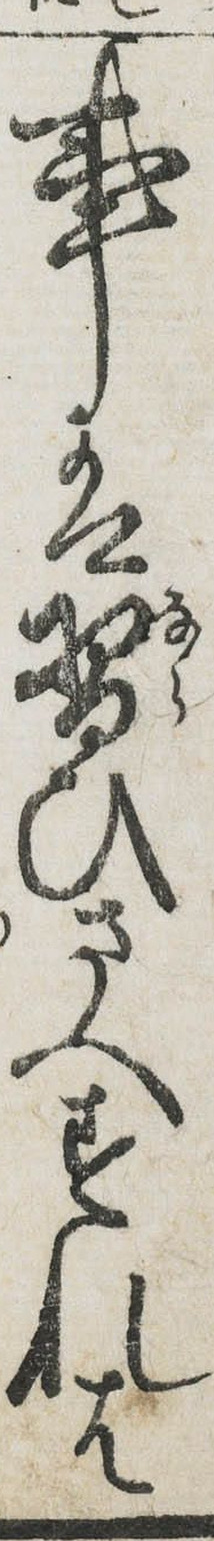事は習ひさへすれは
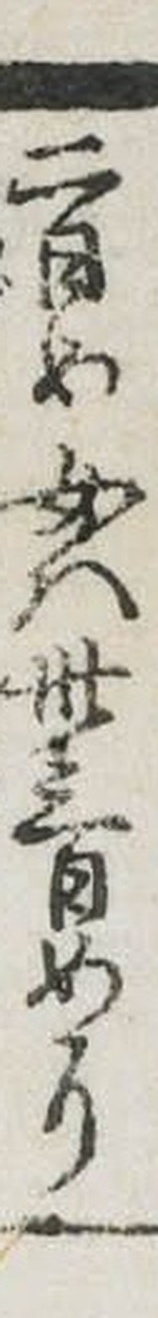二日め女は卅三日めに
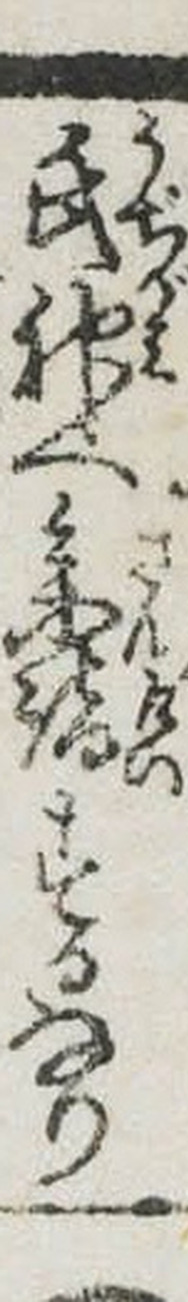氏神へ参詣するなり
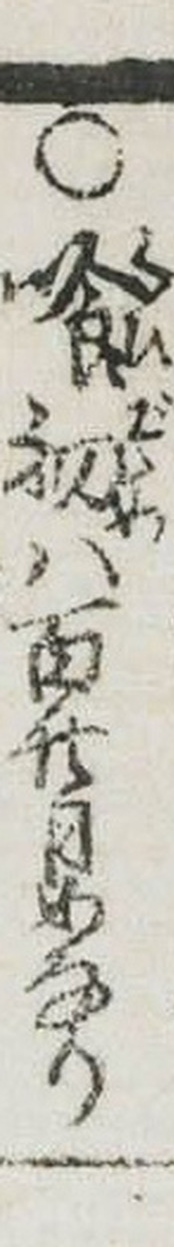○喰初は百廿日めなり
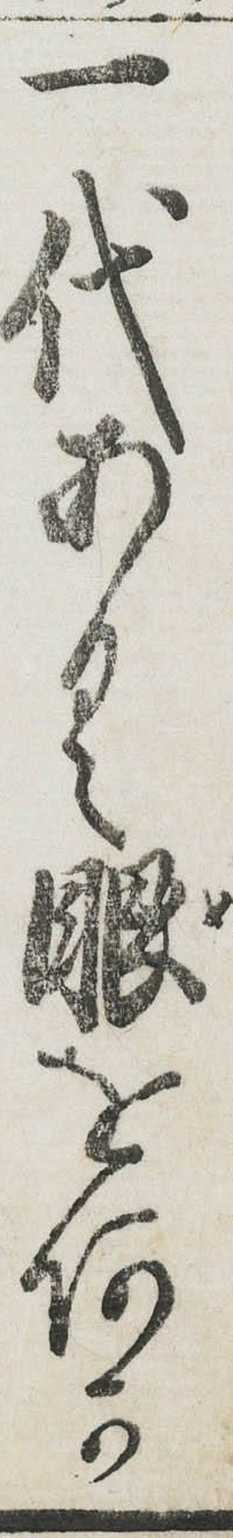一代あく眼をあか
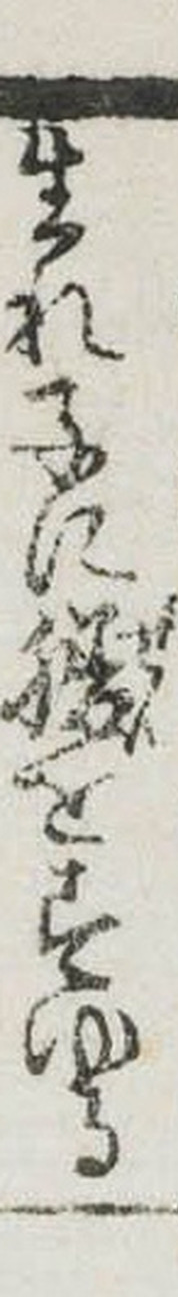生れ子に膳をすゆる
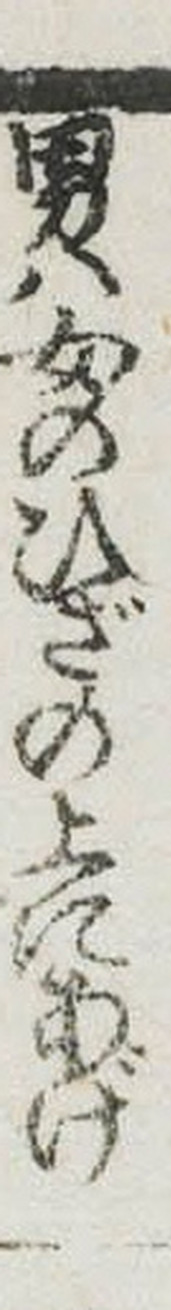男は女のひざの上にあげ
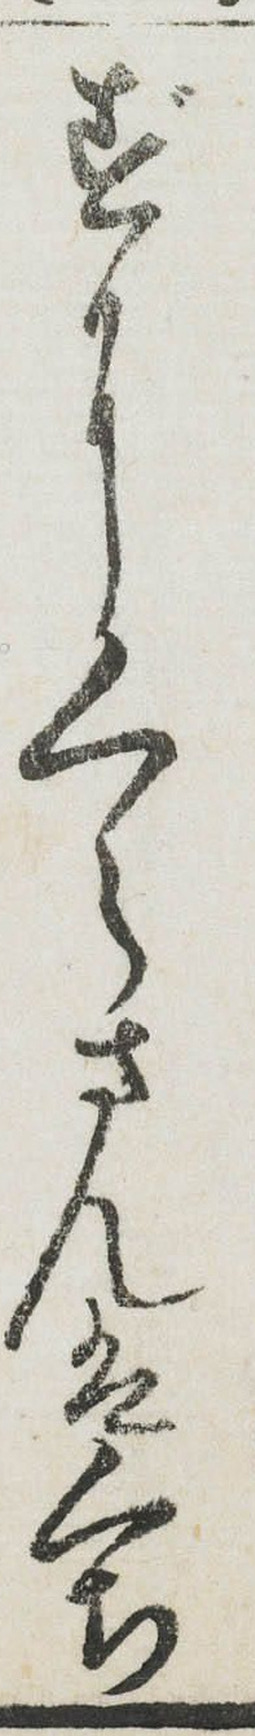ずにくらさんはくち
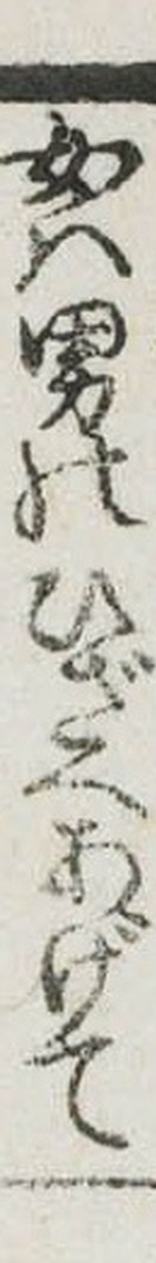女は男のひざへあげて
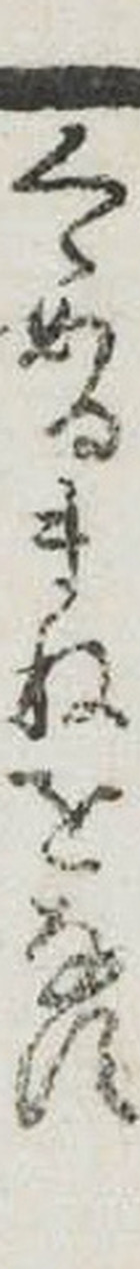くゝめるまねをなす
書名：頭書萬用婦人手紙之文言
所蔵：東京学芸大学教育コンテンツアーカイブ
